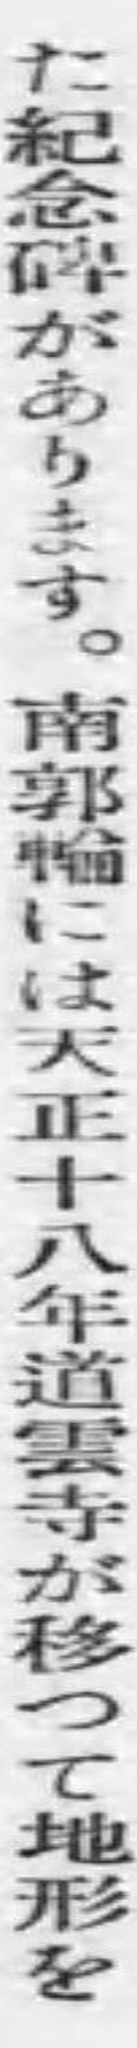た紀念碑があります。南郭輪には天正十八年道雲寺が移つて地形を
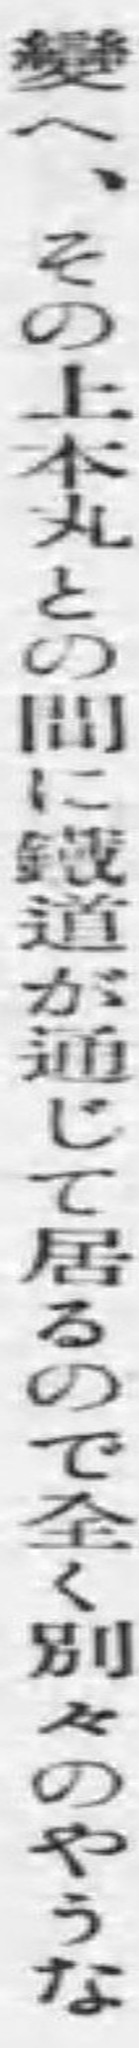変へ、その上本丸との間に鉄道が通じて居るので全く別々のやうな
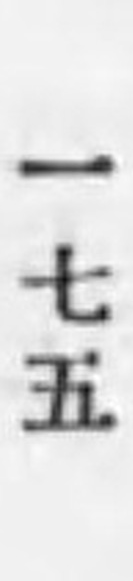一七五

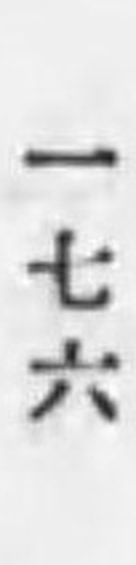一七六
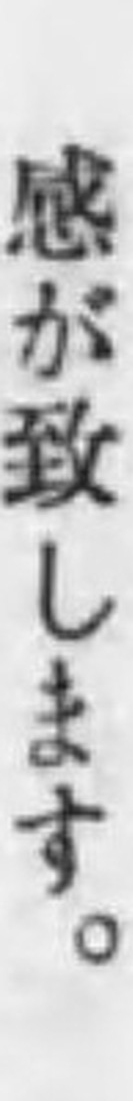感が致します。
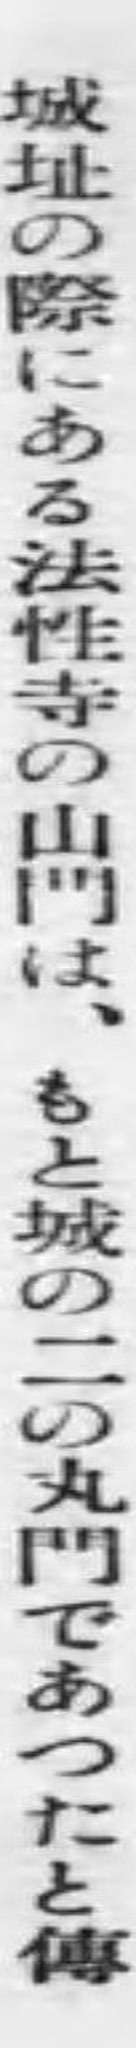城址の際にある法性寺の山門は、もと城の二の丸門であつたと伝
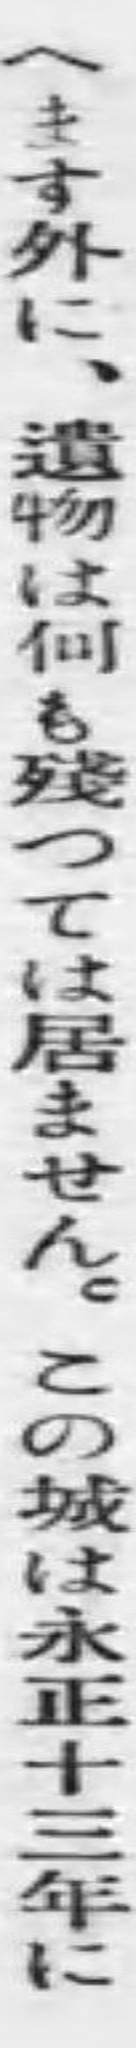へます外に、遺物は何も残つては居ません。この城は永正十三年に
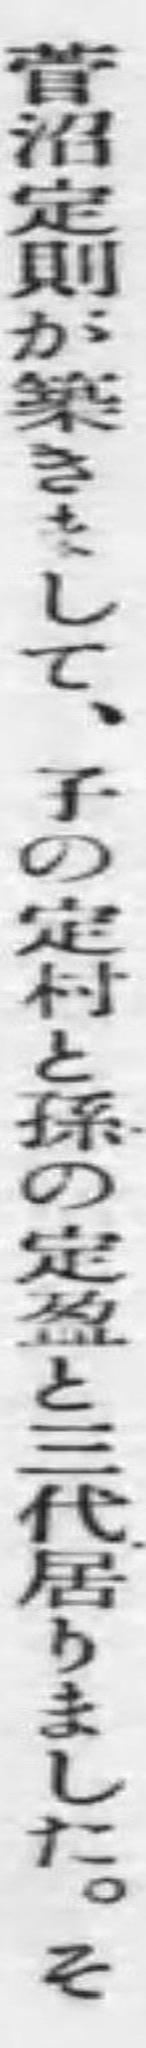菅沼定則が築きまして、子の定村と孫の定盈と三代居りました。そ
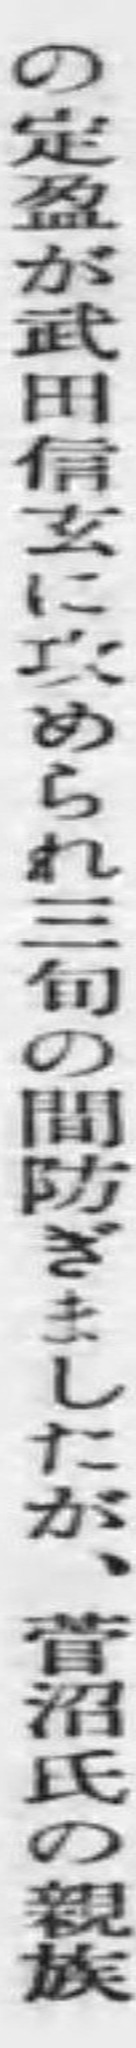の定盈が武田信玄に攻められ三旬の間防ぎましたが、菅沼氏の親族
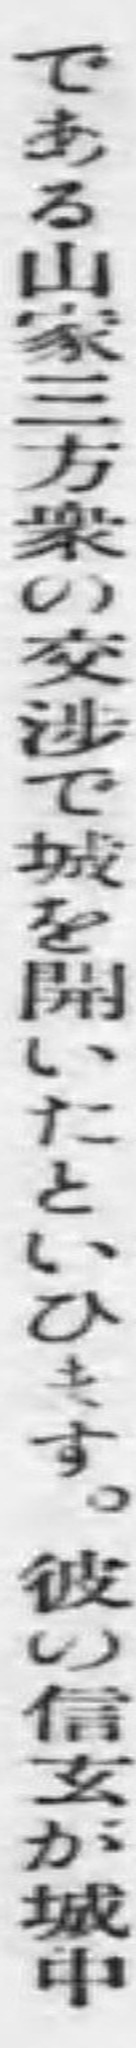である山家三方衆の交渉で城を開いたといひます。彼の信玄が城中
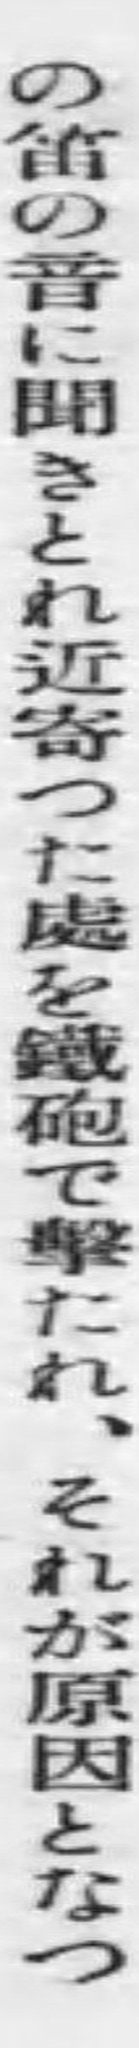の笛の音に聞きとれ近寄つた処を鉄砲で撃たれ、それが原因となつ
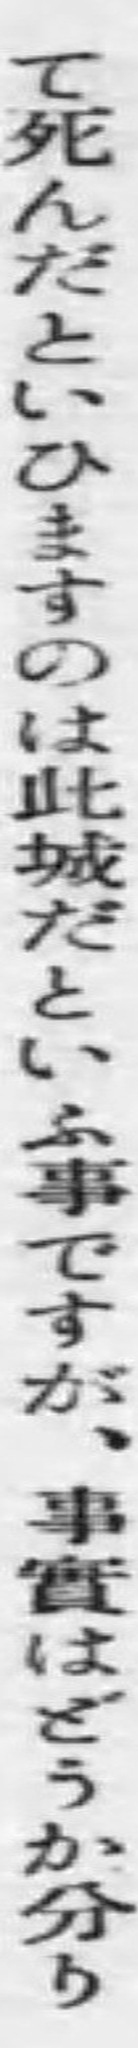て死んだといひますのは此城だといふ事ですが、事実はどうか分り
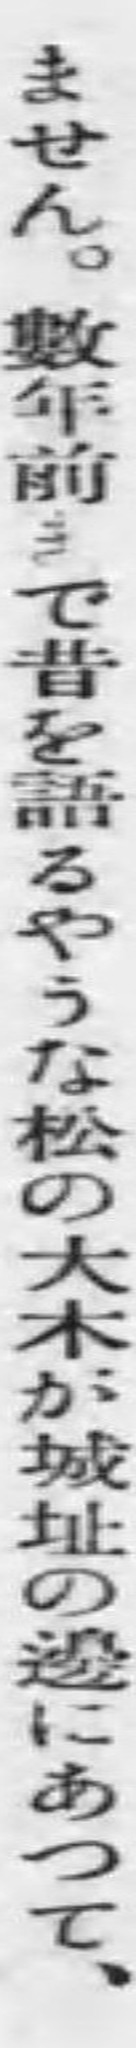ません。数年前まで昔を語るやうな松の大木が城址の辺にあつて、
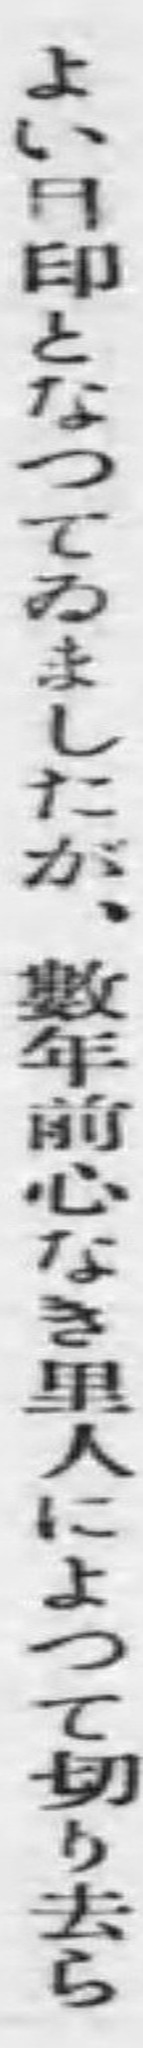よい目印となつてゐましたが、数年前心なき里人によつて切り去ら
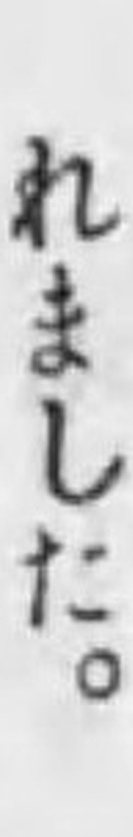れました。
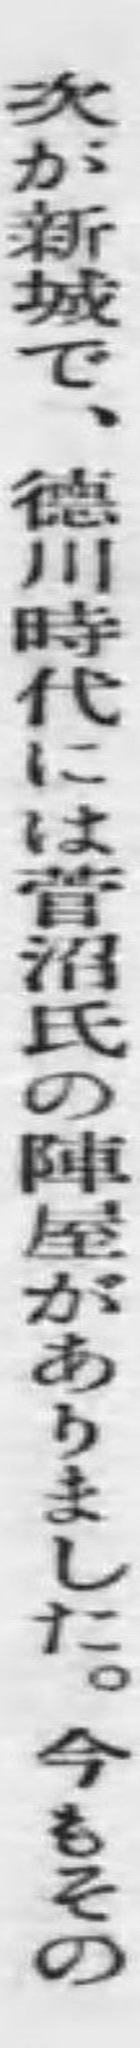次が新城で、徳川時代には菅沼氏の陣屋がありました。今もその
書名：東三河道中記 : 豊橋市及其附近案内
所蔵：国立国会図書館 National Diet Library, JAPAN
